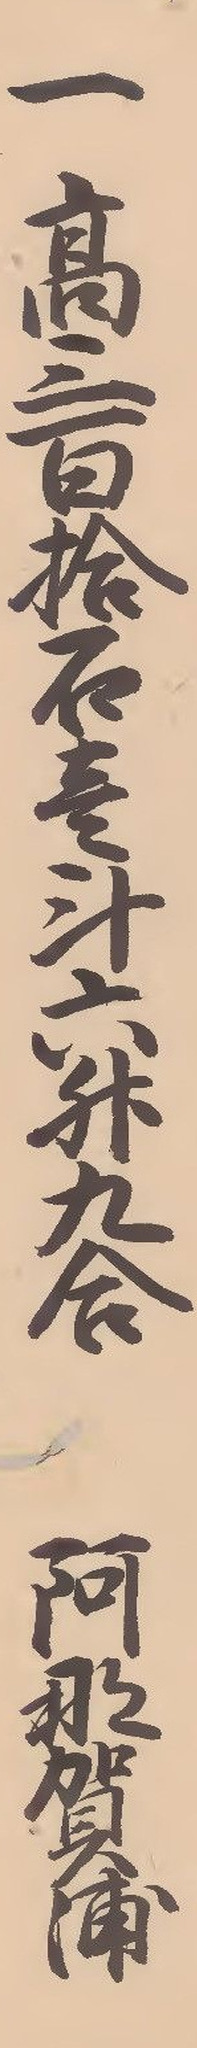一高三百拾石壱斗六升九合阿那賀浦

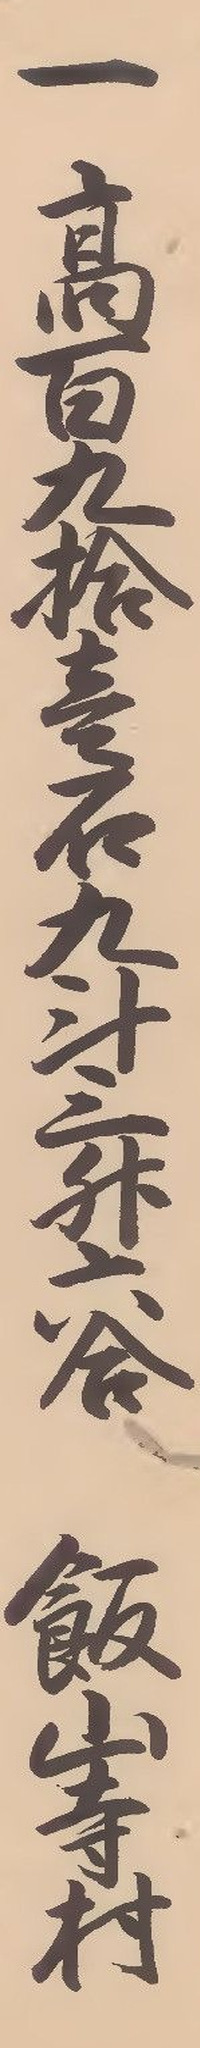一高百九拾壱石九斗三升六合飯山寺村
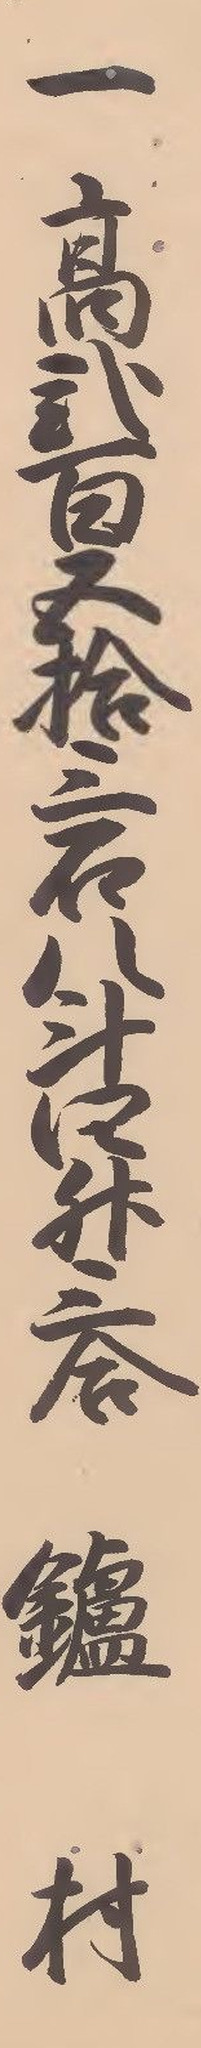一高弐百五拾三石八斗四升三合鑪村
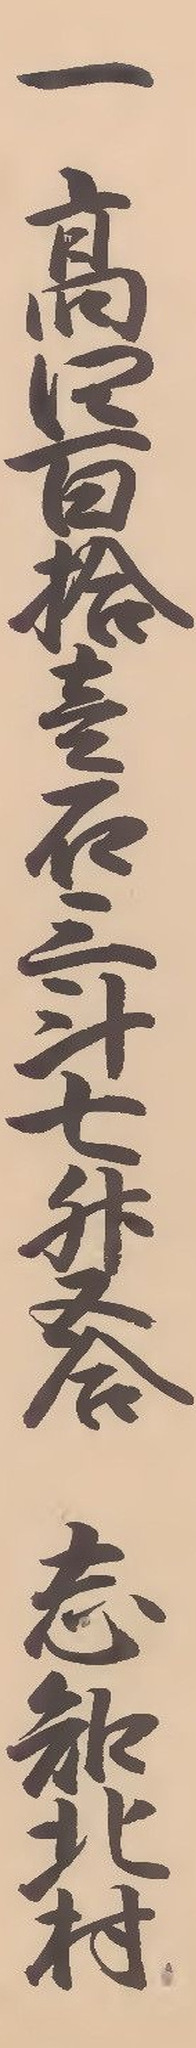一高四百拾壱石三斗七升五合志知北村
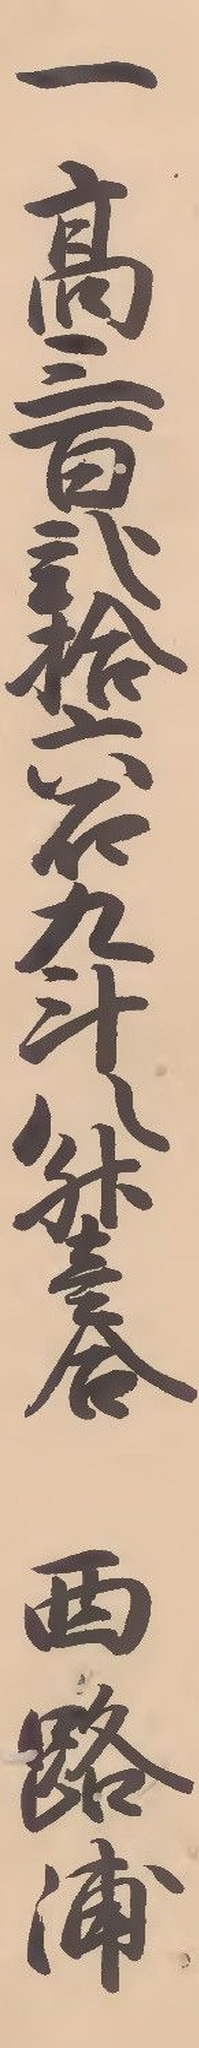一高三百弐拾六石九斗八升壱合西路浦
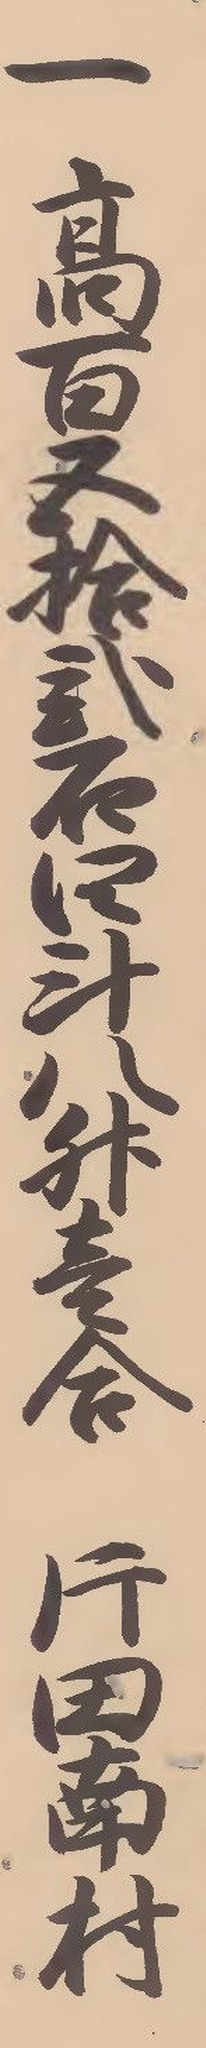一高百五拾弐石四斗八升壱合片田南村
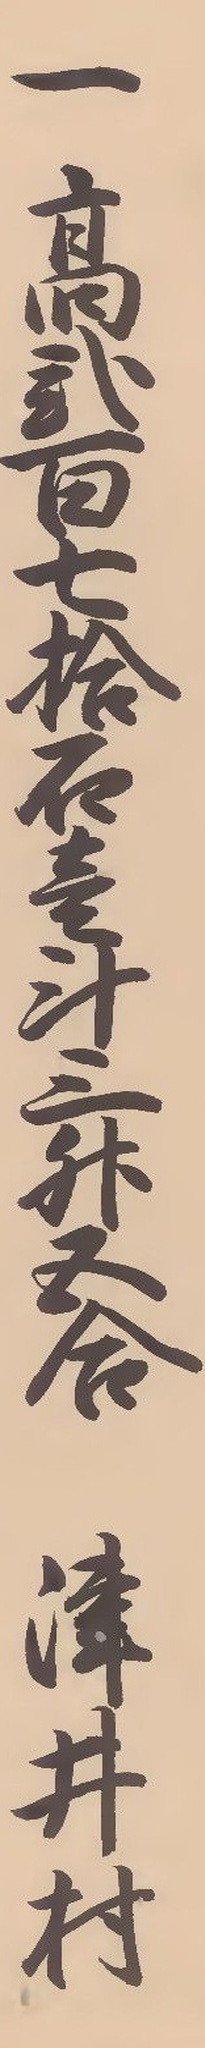一高弐百七拾石壱斗三升五合津井村
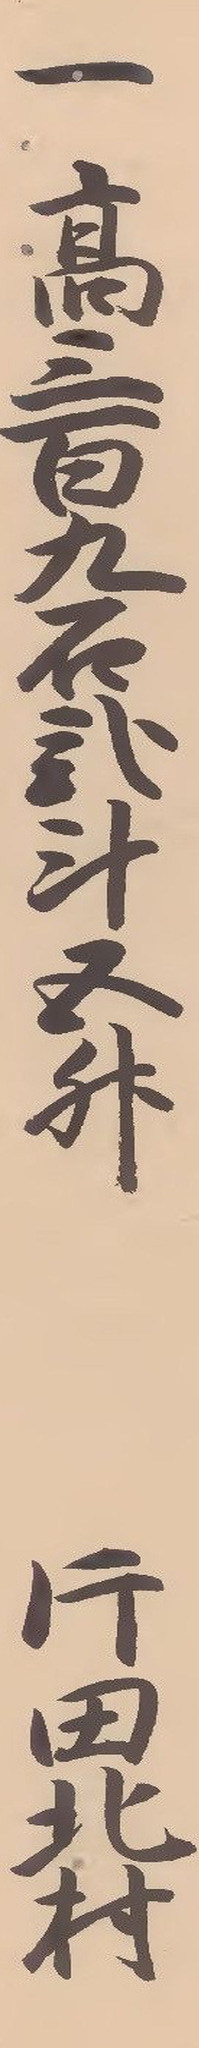一高三百九石弐斗五升片田北村
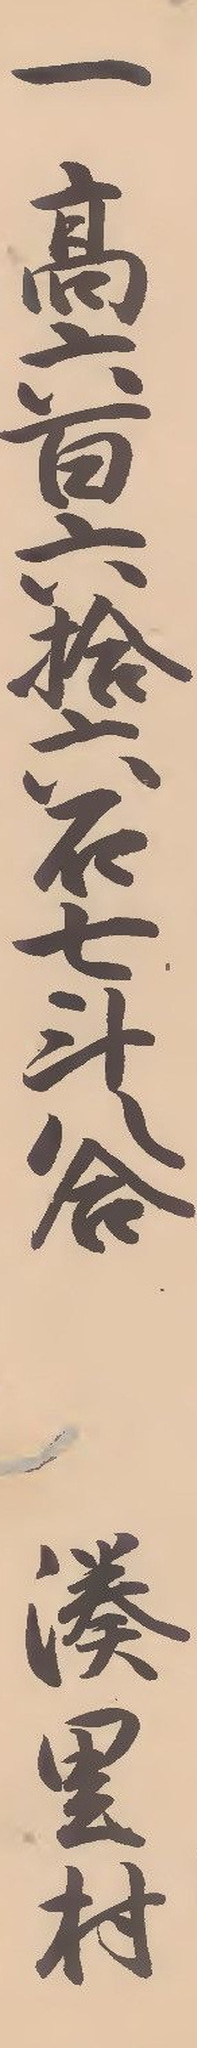一高六百六拾六石七斗八合湊里村

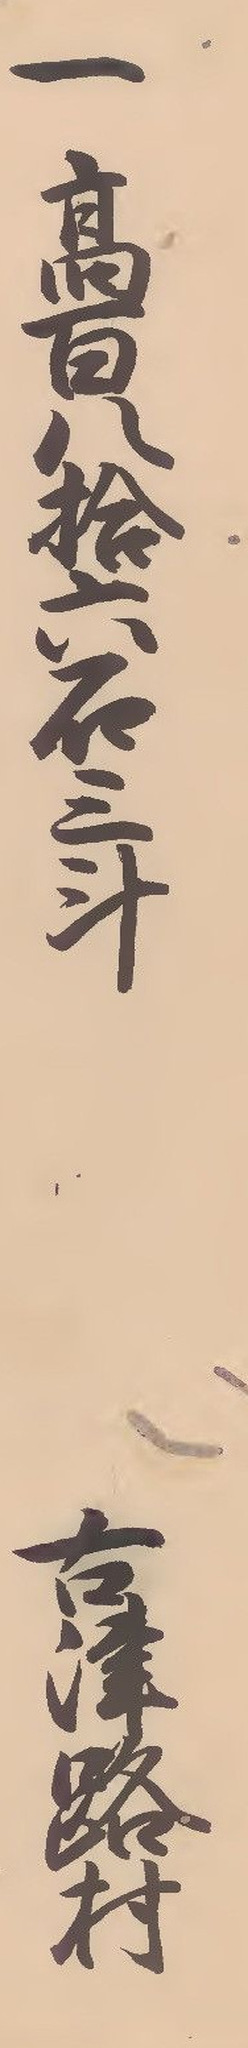一高百八拾六石三斗古津路村
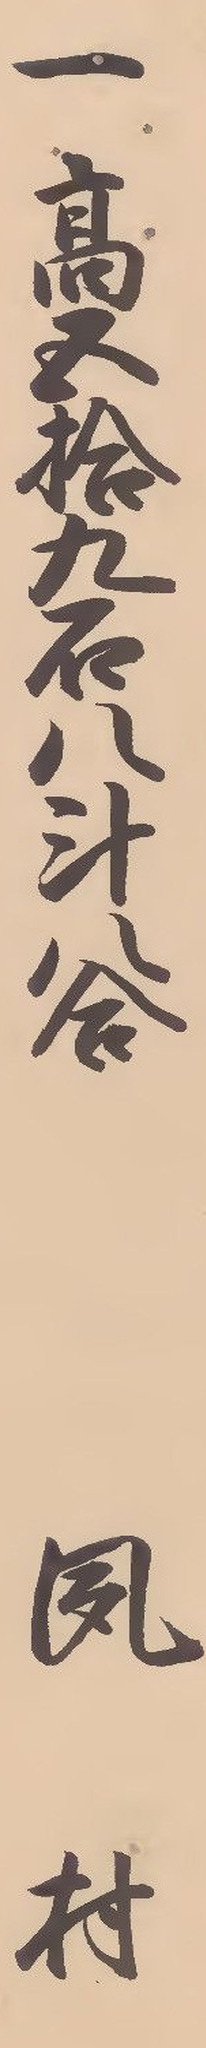一高五拾九石八斗八合夙村
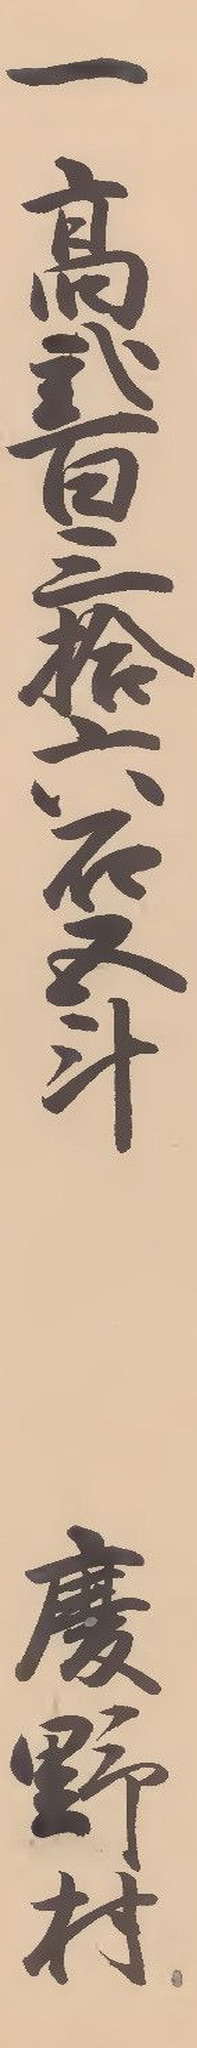一高弐百三拾六石五斗広野村
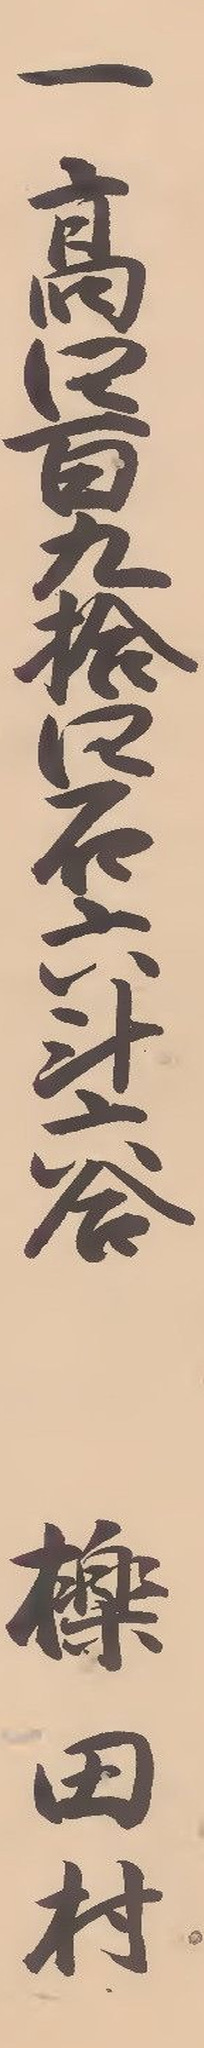一高四百九拾四石六斗六合櫟田村
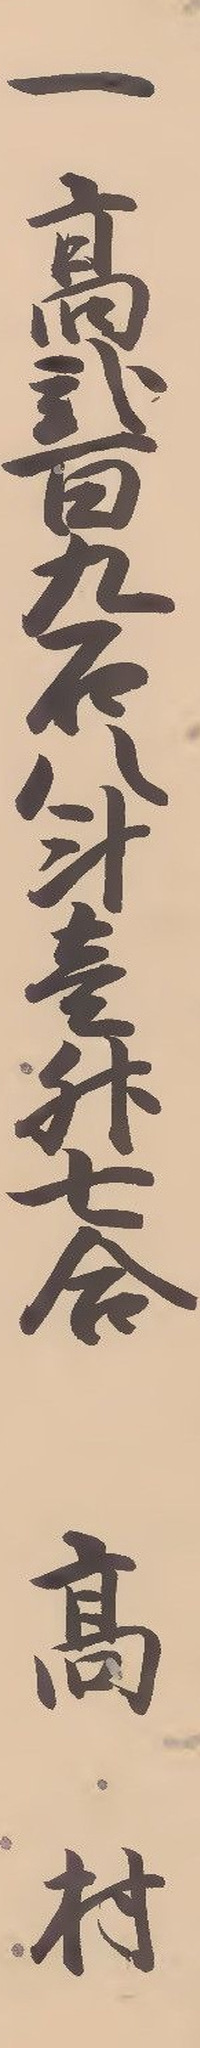一高弐百九石八斗壱升七合高村
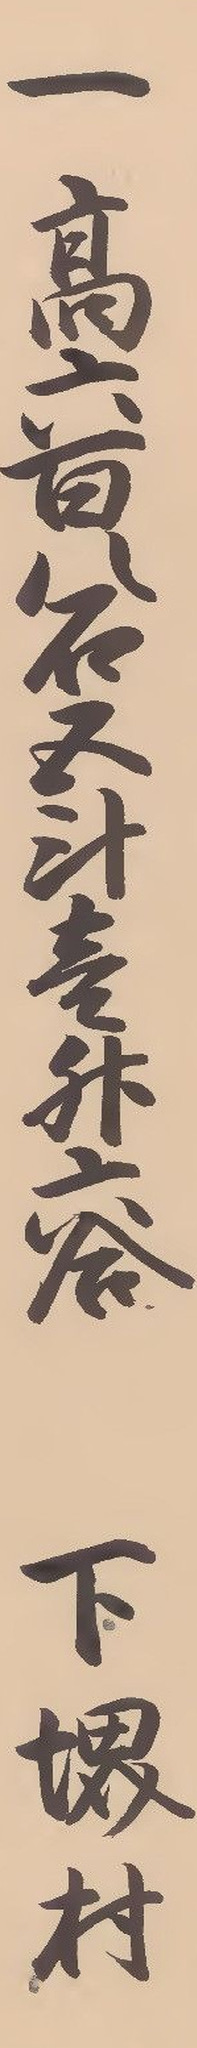一高六百八石五斗壱升六合下堺村
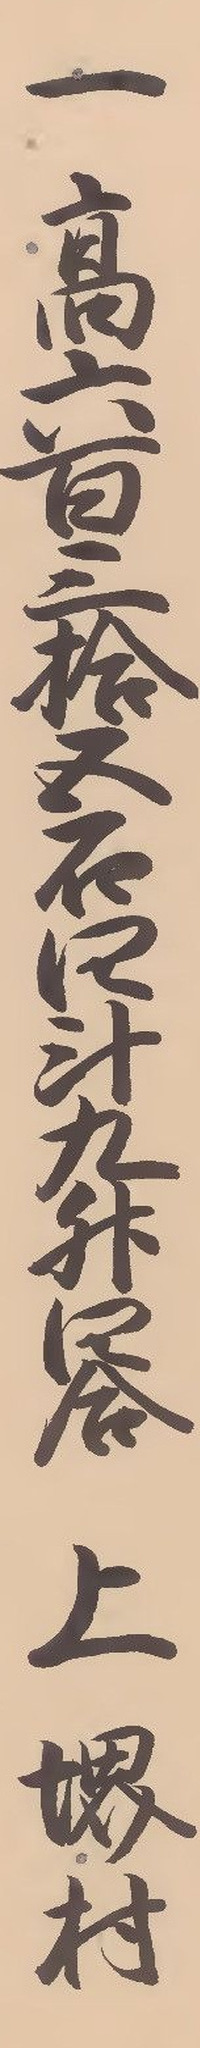一高六百三拾五石四斗九升四合上堺村
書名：淡路国郷帳
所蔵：国立公文書館 National Archives of Japan
